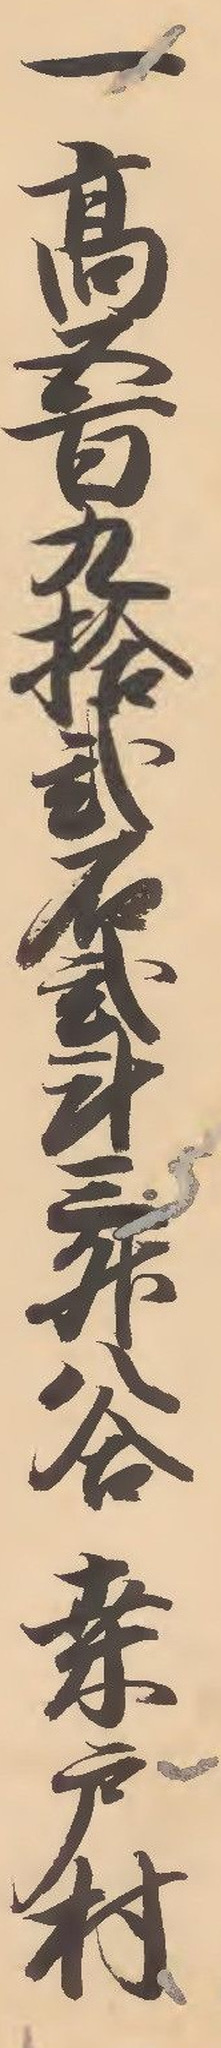一高五百九拾弐石弐斗三升八合桑戸村
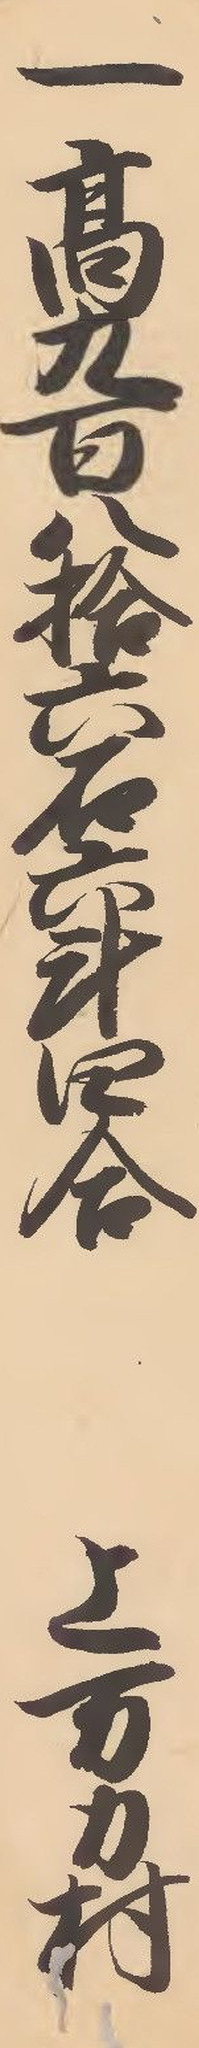一高九百八拾六石六斗四合上万力村
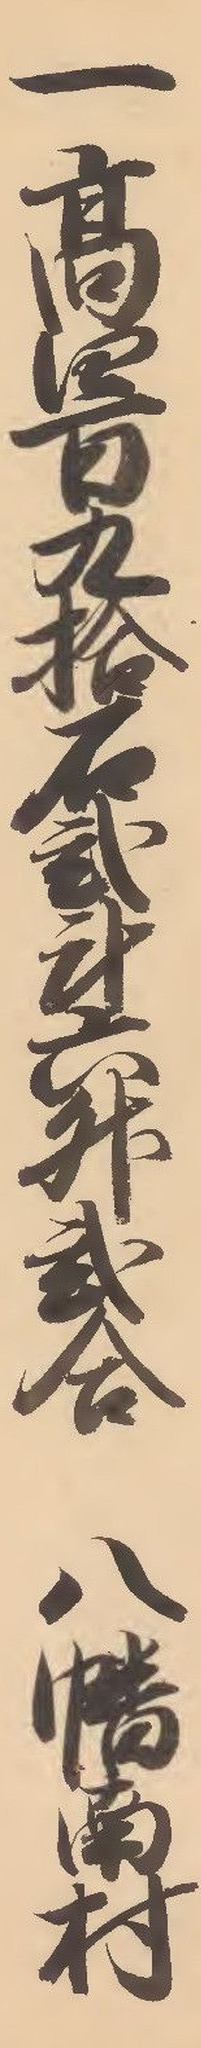一高四百九拾石弐斗六升弐合八幡南村
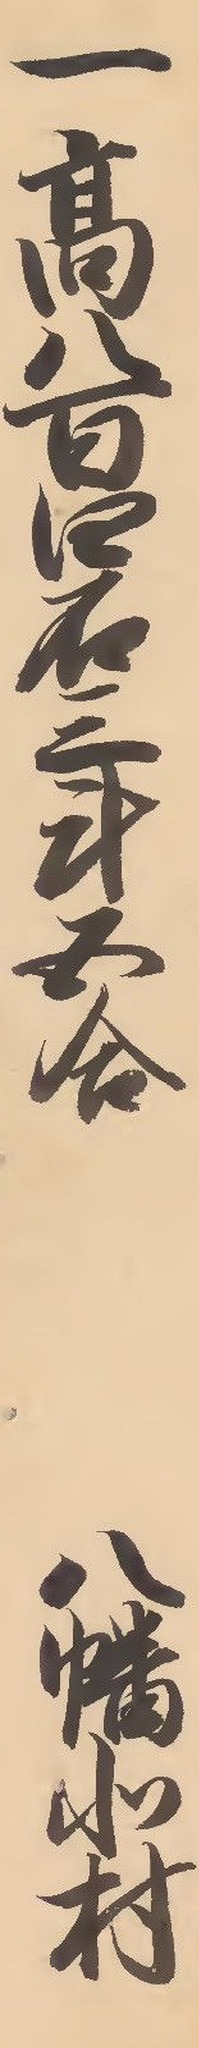一高八百四石三斗五合八幡北村
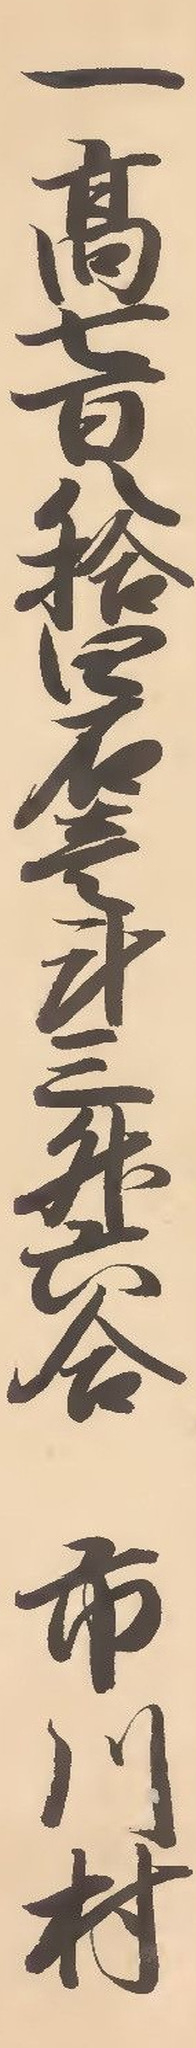一高七百八拾四石壱斗三升六合市川村
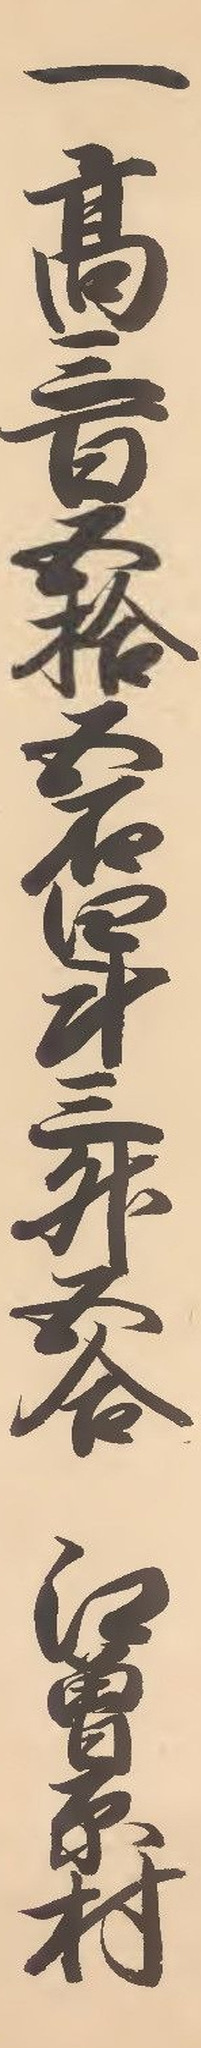一高三百五拾五石四斗三升五合江曽原村
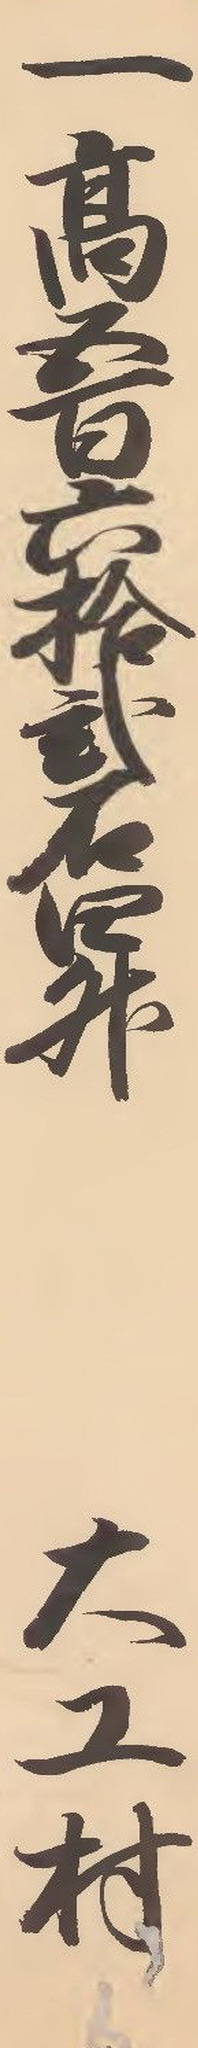一高五百六拾弐石四升大工村

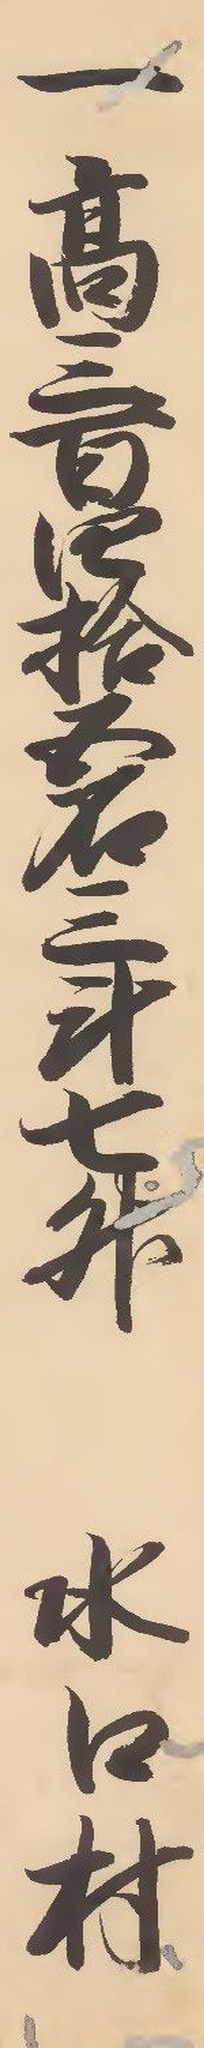一高三百四拾五石三斗七升水口村
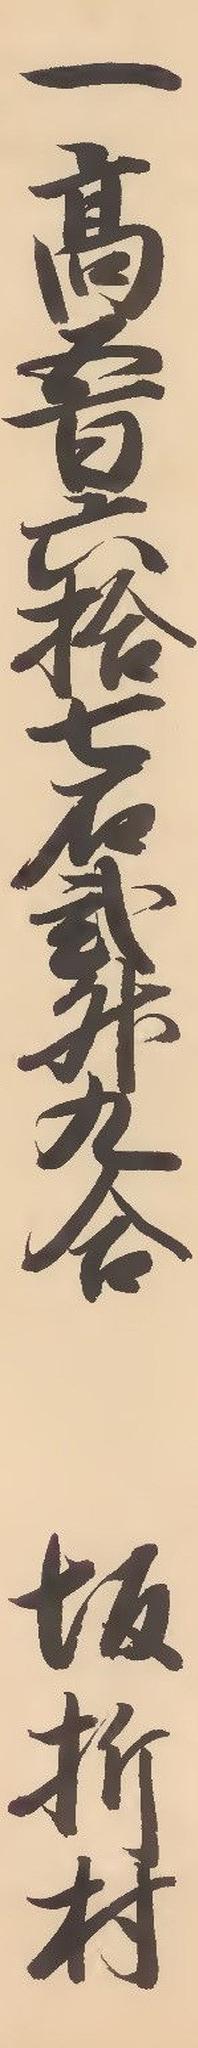一高五百六拾七石弐升九合坂折村
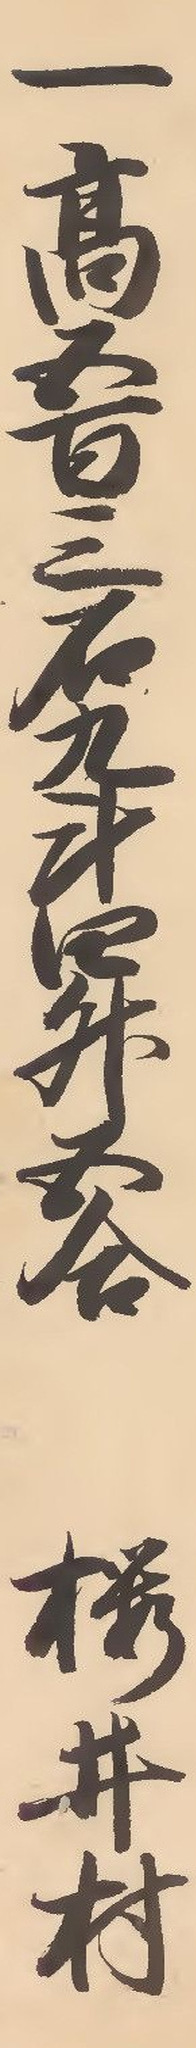一高五百三石九斗四升五合桜井村
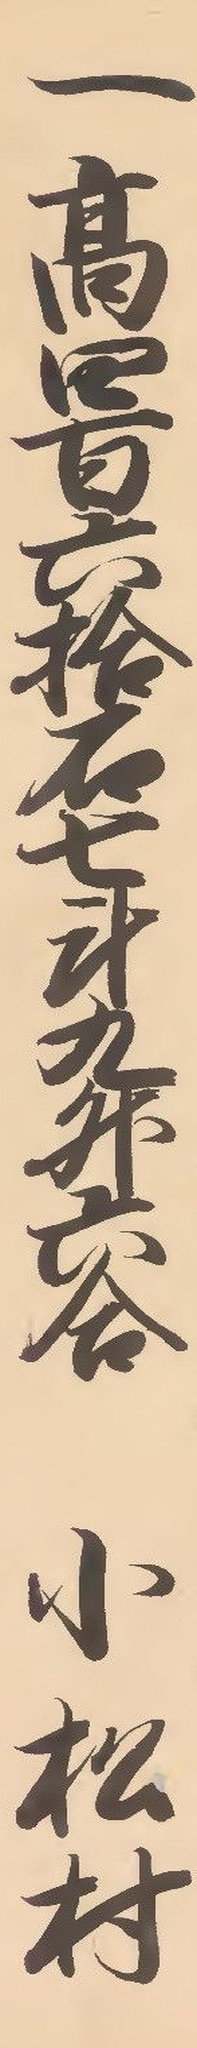一高四百六拾石七斗九升六合小松村
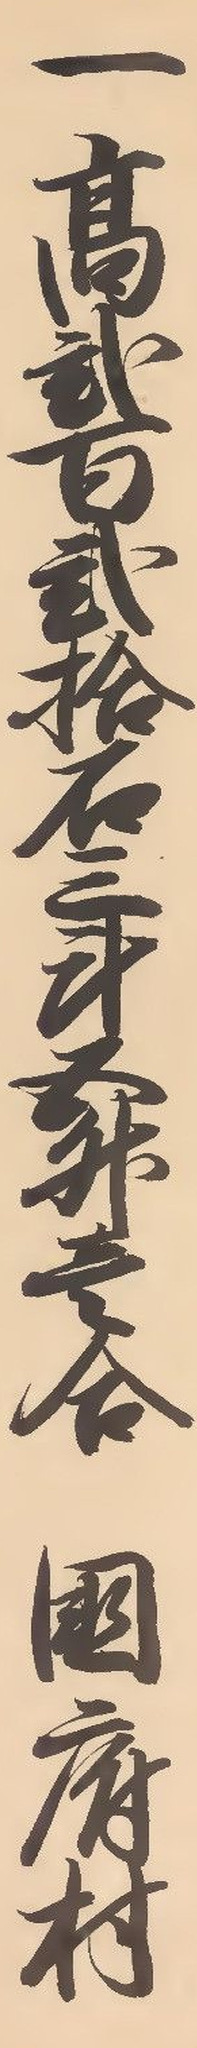一高弐百弐拾石三斗五升壱合国府村
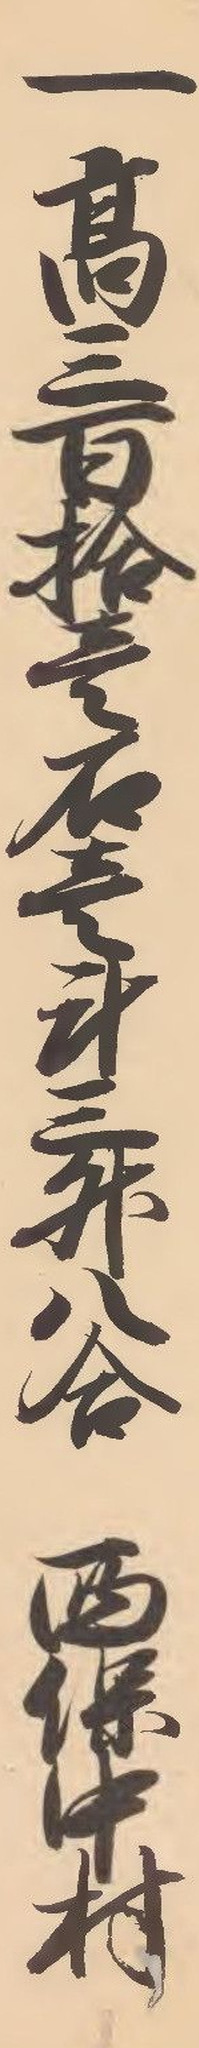一高三百拾壱石壱斗三升八合西保中村
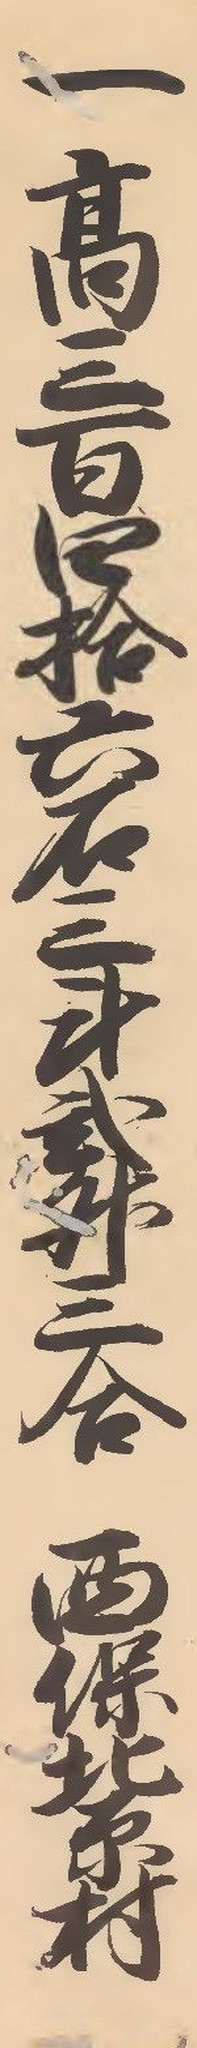一高三百四拾六石三斗弐升三合西保北原村

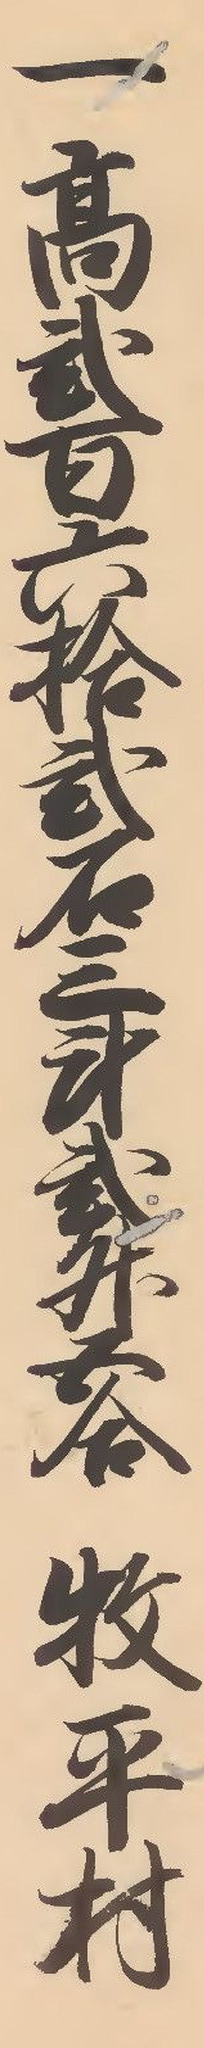一高弐百六拾弐石三斗弐升五合牧平村
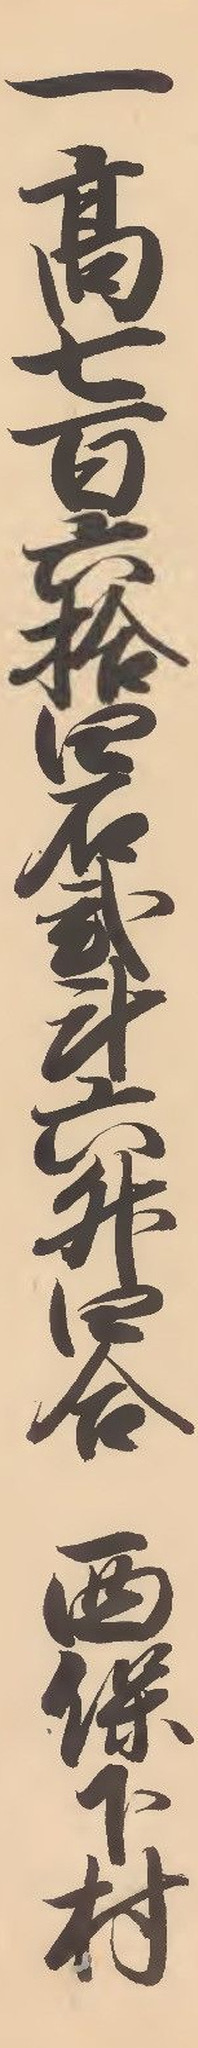一高七百六拾四石弐斗六升四合西保下村
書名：甲斐国郷帳
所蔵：国立公文書館 National Archives of Japan
